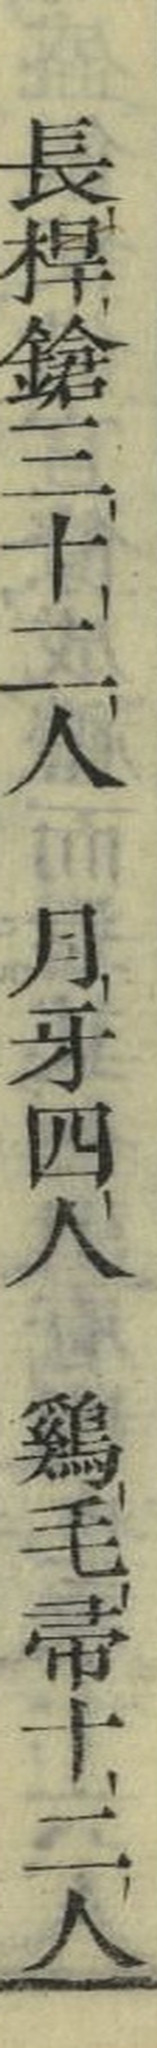長-杆-鎗三-十-二-人月-牙四-人鶏-毛-帚十-二-人
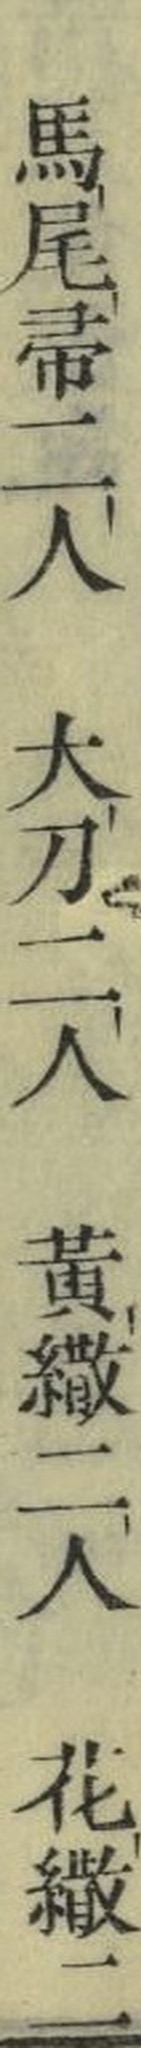馬-尾-帚二-人大-刀二-人黃-繖二-人花-繖二-
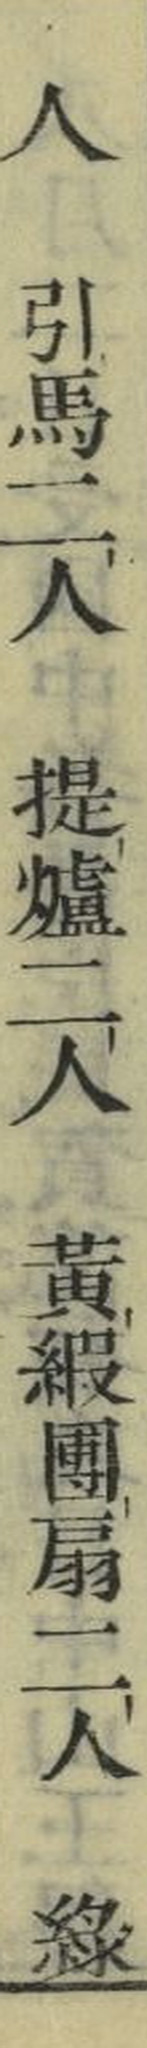人引-馬二-人提-炉二-人黄-縀団-扇二-人緑-
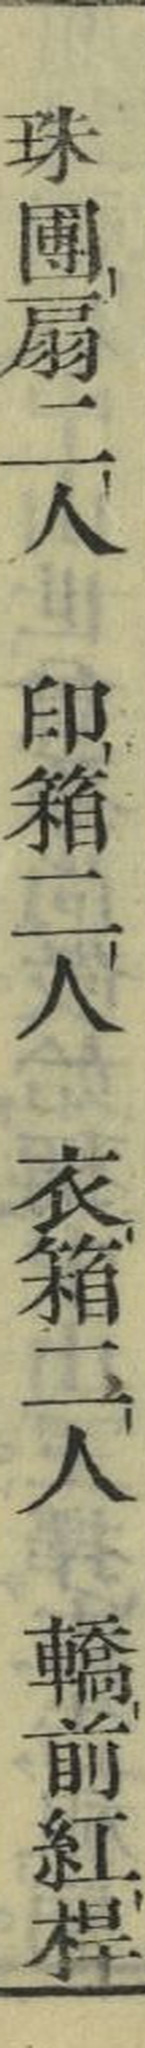珠団-扇二-人印-箱二-人衣-箱二-人轎-前紅-杆
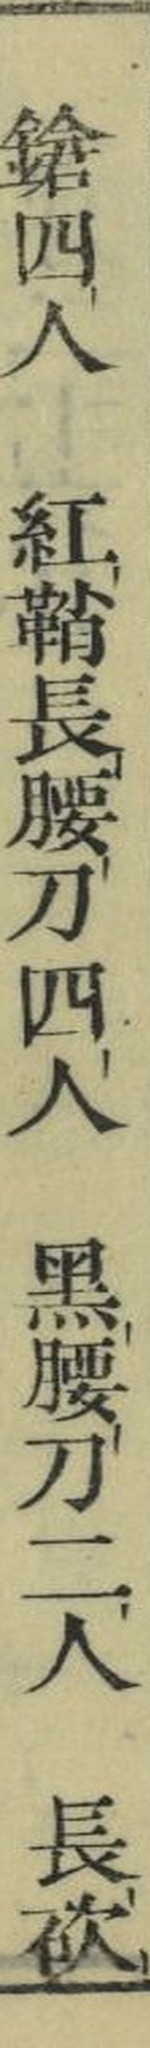鎗四-人紅-鞘長-腰-刀四-人黒-腰-刀二-人長-砍-
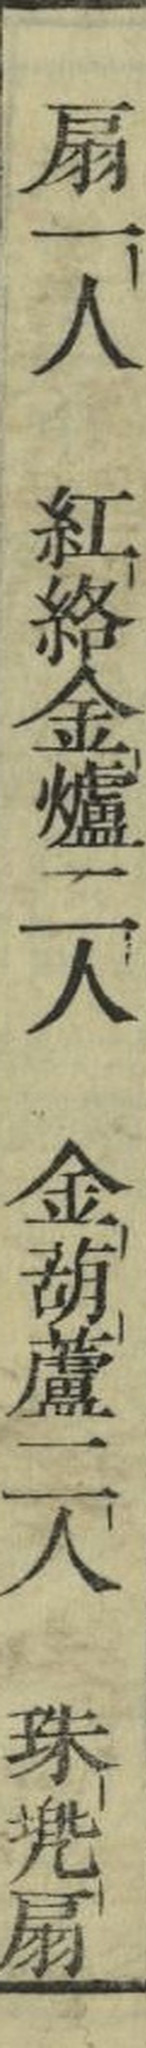扇一-人紅-絡金-炉二-人金-葫-蘆二-人珠-兜-扇
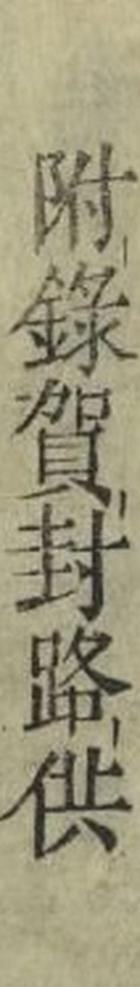附-録賀-封路-供

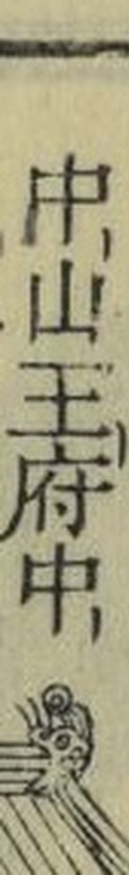中-山王-府中-

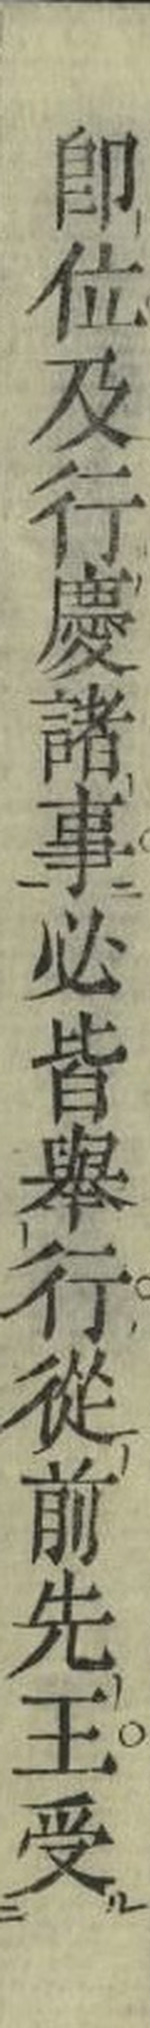即-位。及行-慶諸-事。必皆挙-行。従-前先-王。受

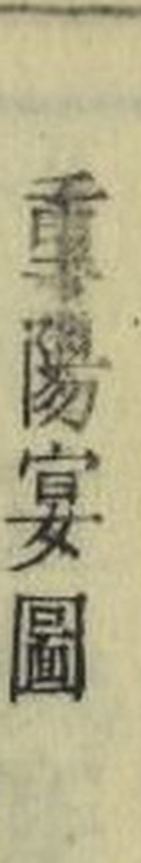重陽宴図

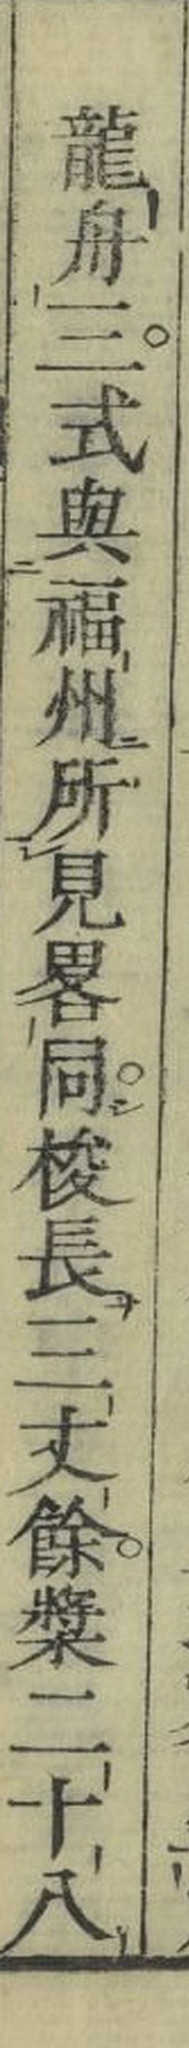竜-舟-三。式与福-州所レ見略-同。梭長三-丈-余。槳二-十-八-

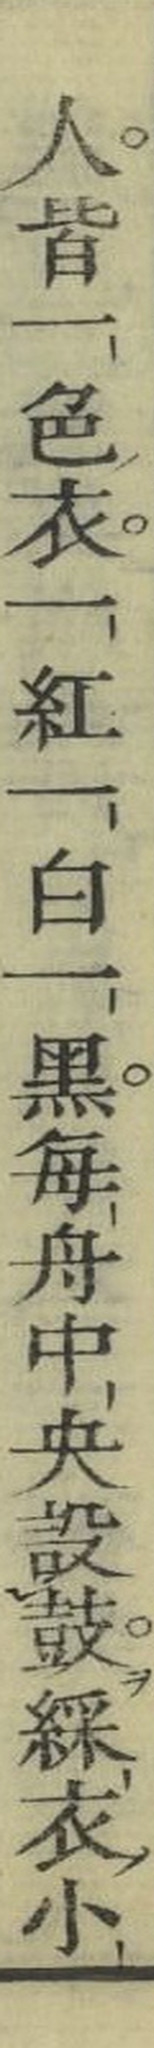人。皆一-色衣。一-紅一-白一-黒。毎-舟中-央設鼓。綵-衣小-
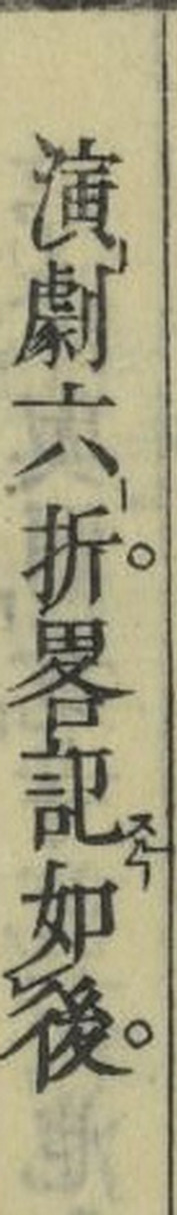演-劇六-折。略記ヿ如後。
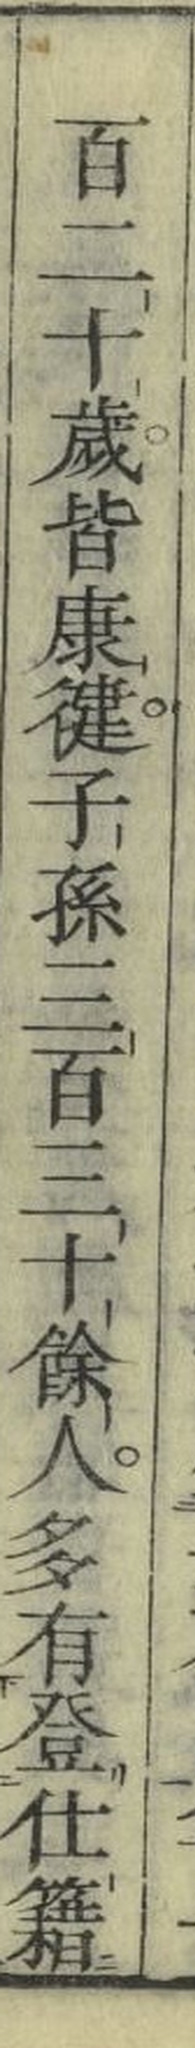百二-十-歳。皆康-徤。子-孫三-百三-十-余-人。多有登仕-籍

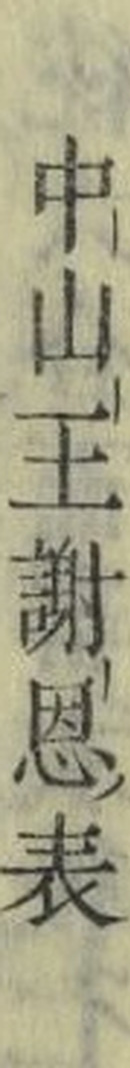中-山-王謝-恩表
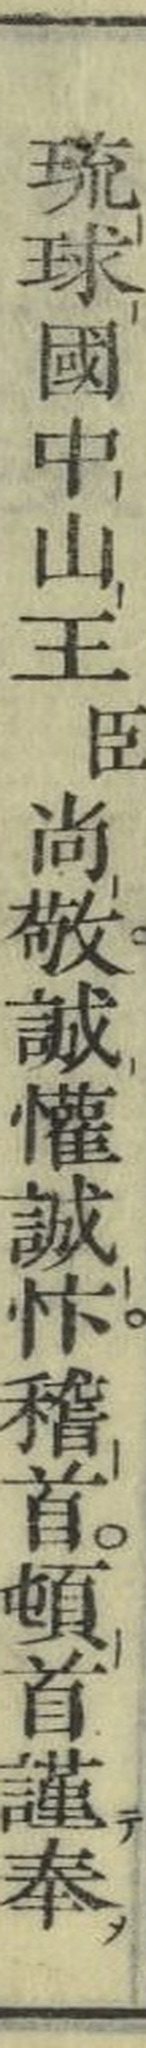琉-球-国中-山-王臣尚-敬。誠-懽誠-忭。稽-首。頓-首謹奉
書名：中山伝信録 巻二
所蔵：University of the Ryukyus Library
